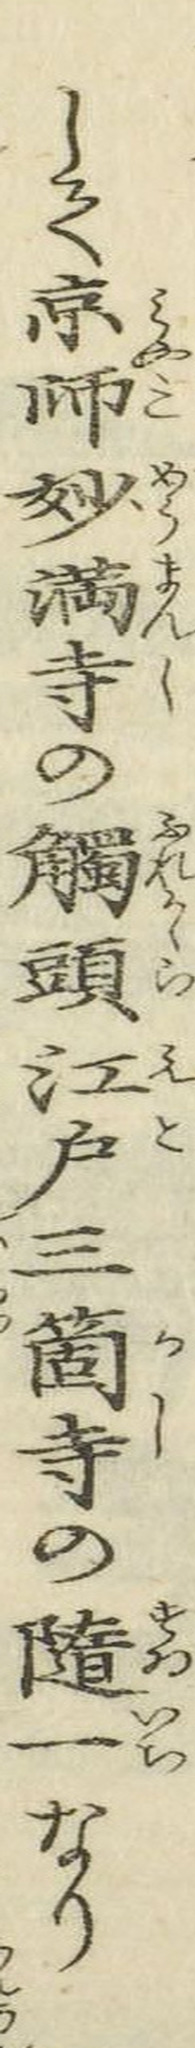して京師妙満寺の觸頭江戸三箇寺の随一なり
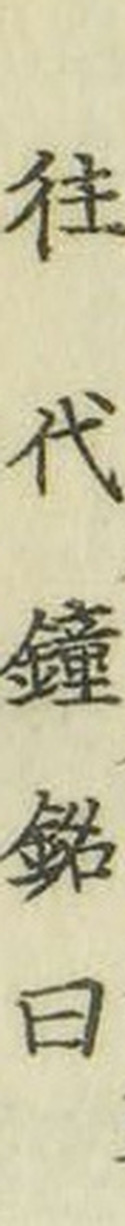往代鐘銘曰
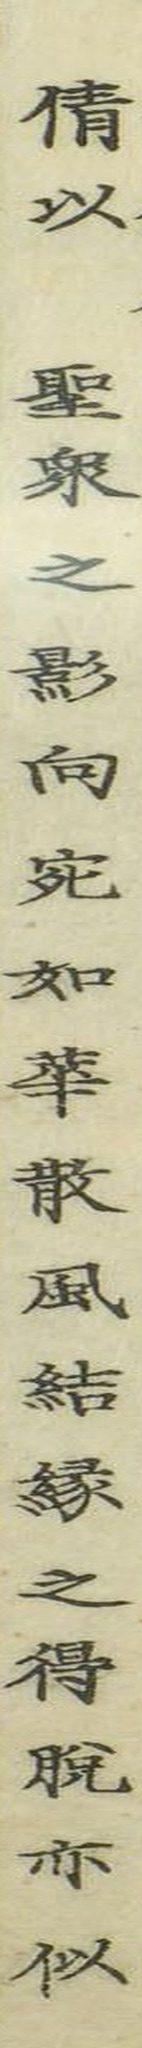倩以聖衆之影向宛如華散風結縁之得脫亦似

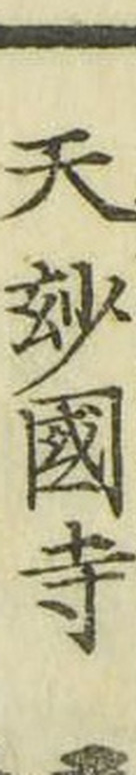天妙國寺
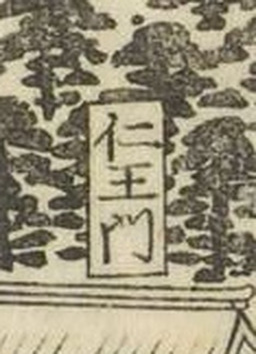仁王門

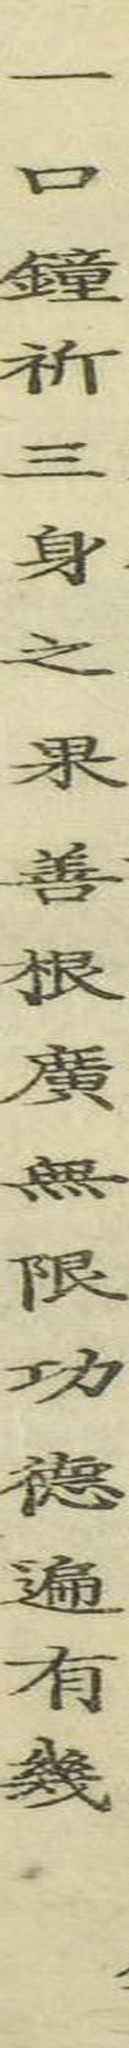一口鐘祈三身之果善根廣無限功德遍有幾
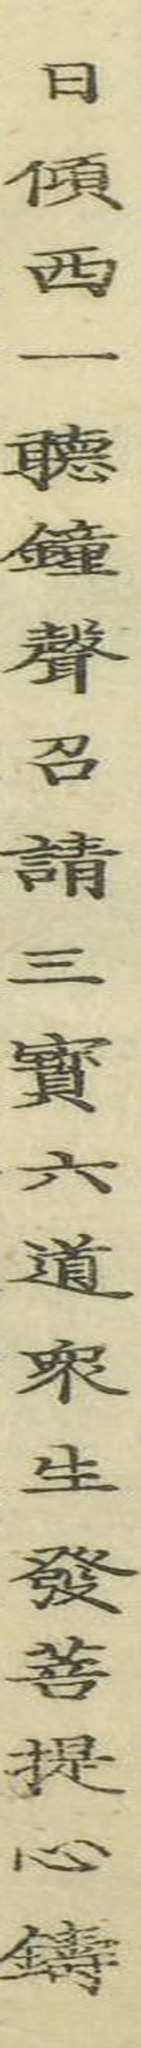日傾西一聽鐘聲召請三寳六道衆生發菩提心鑄
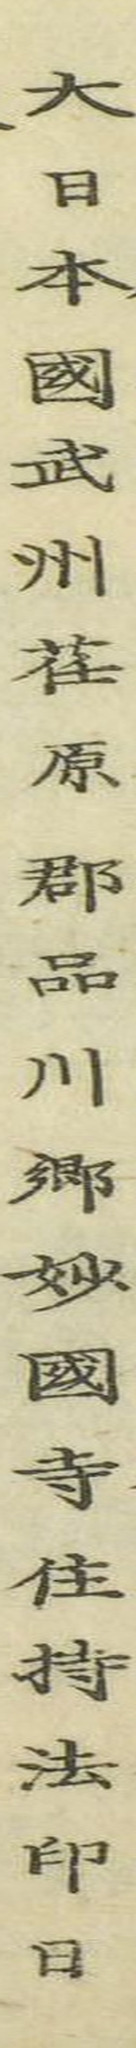大日本國武州荏原郡品川郷妙國寺住持法印日
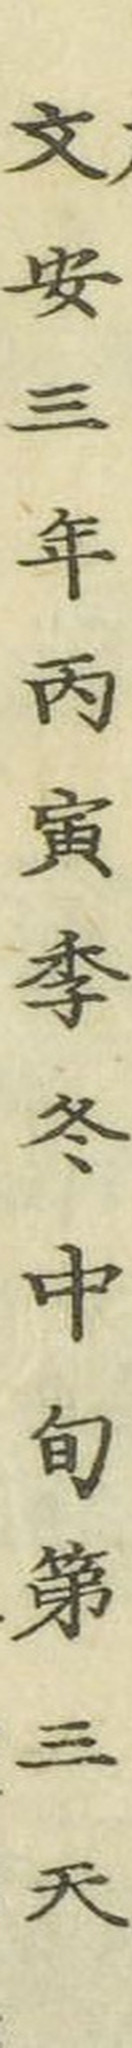文安三年丙寅季冬中旬第三天
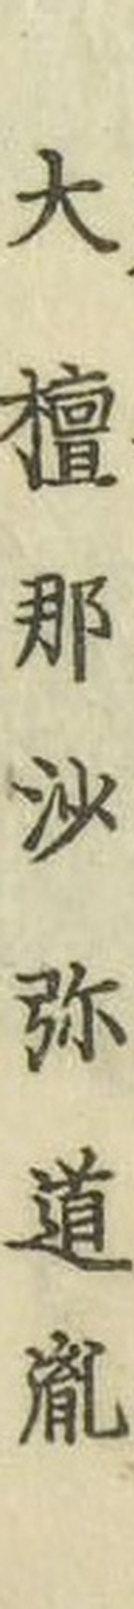大檀那沙弥道胤
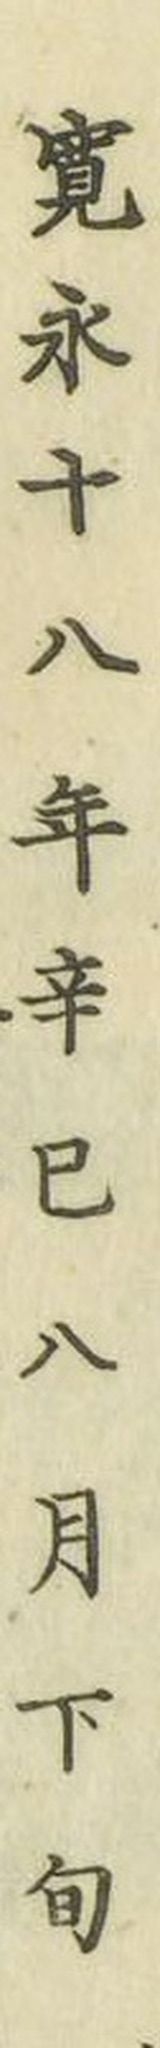寛永十八年辛巳八月下旬
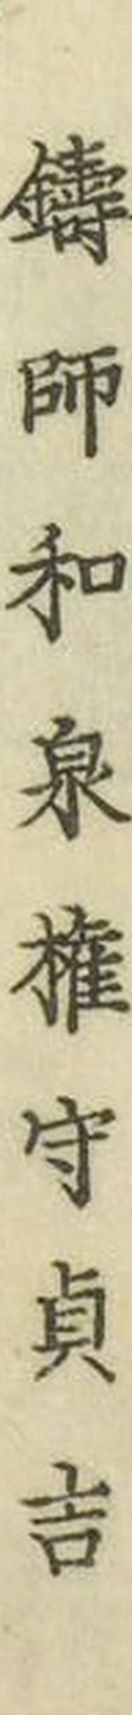鑄師和泉権守貞吉
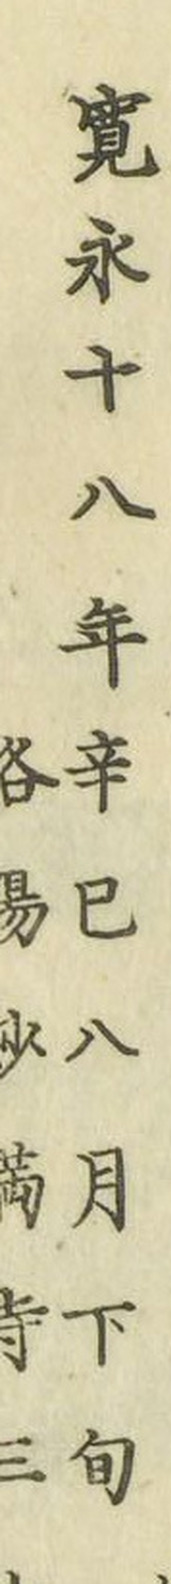寛永十八年辛巳八月下旬
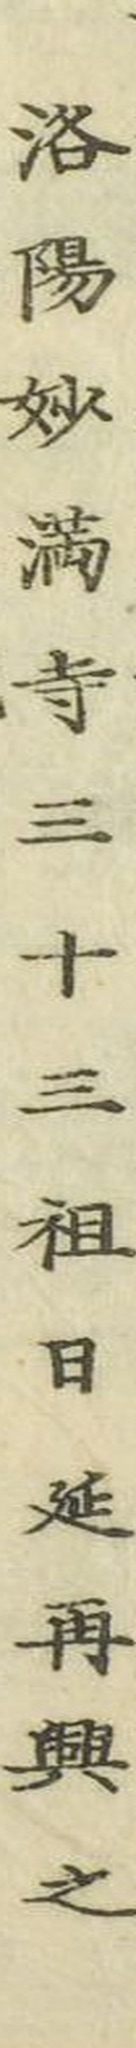洛陽妙満寺三十三祖日延再興之
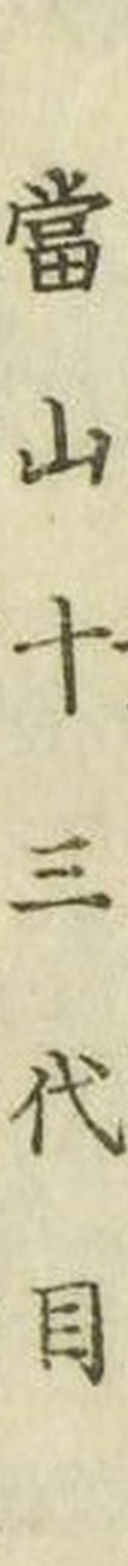當山十三代目
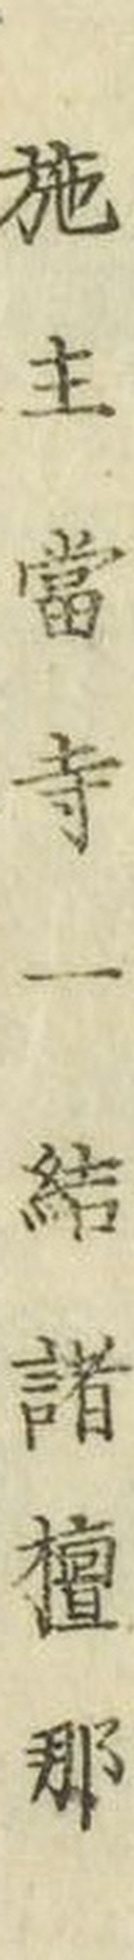施主當寺一結諸檀那
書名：江戸名所図会 20巻 巻之4
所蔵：東京学芸大学教育コンテンツアーカイブ
